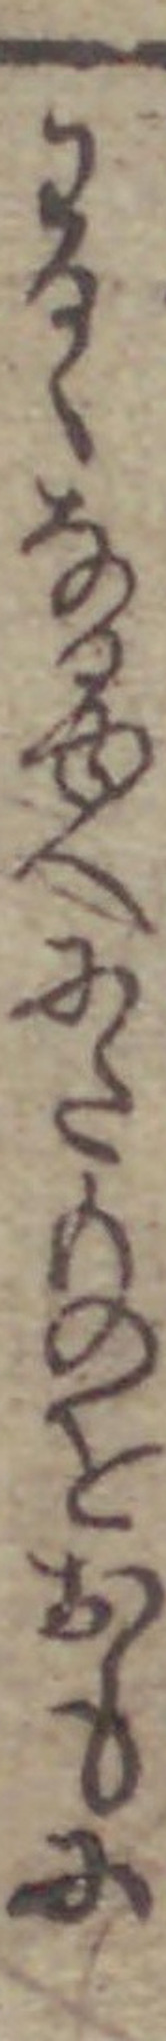わるくなるゆへにたものをおもに
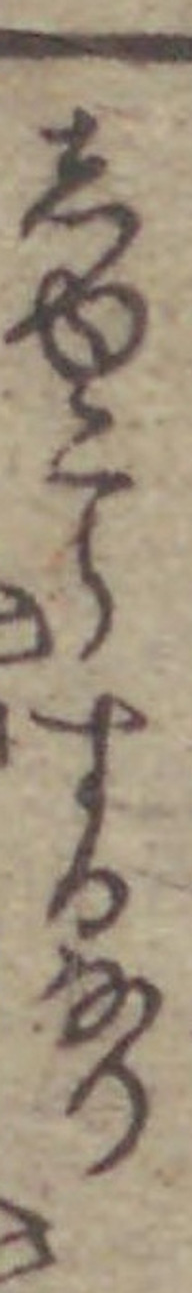しゆこうするなり
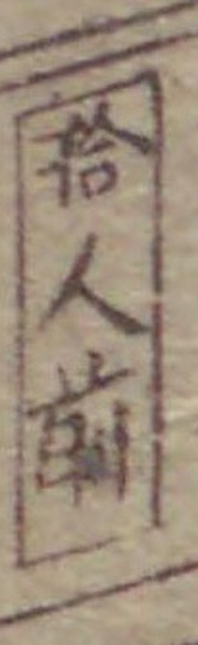拾人前

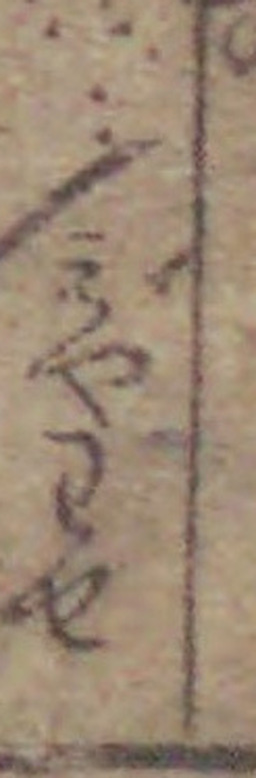みやわせ
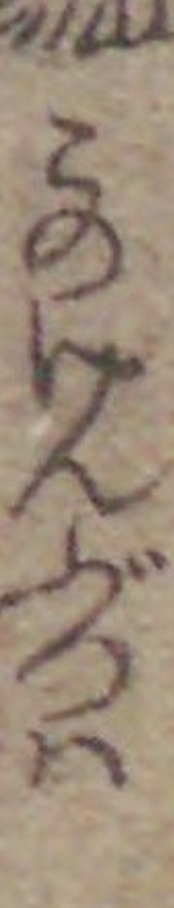このけんぶつは
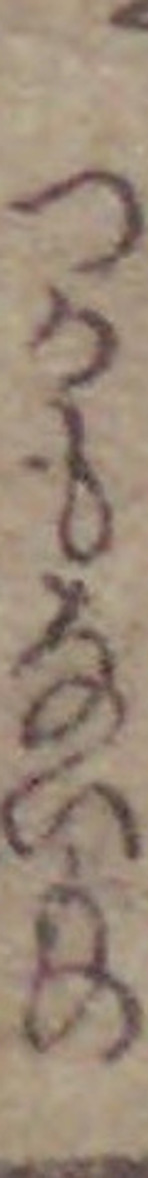つかもないもの
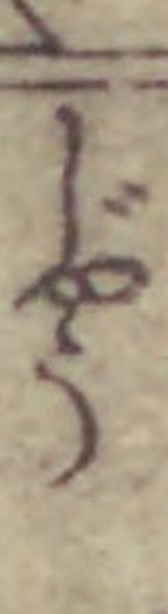じやう
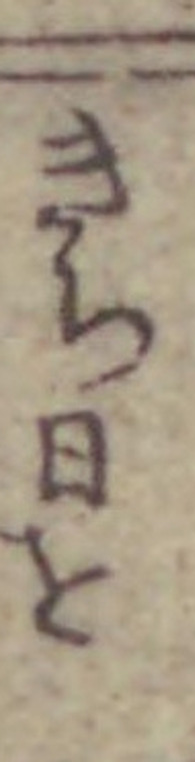きち日を
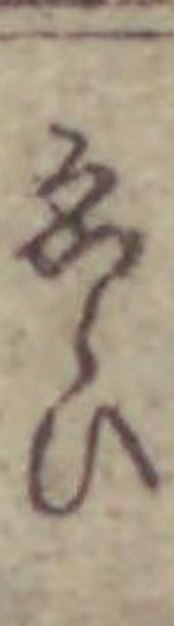ゑらひ
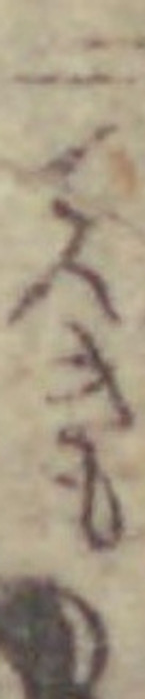てんきも
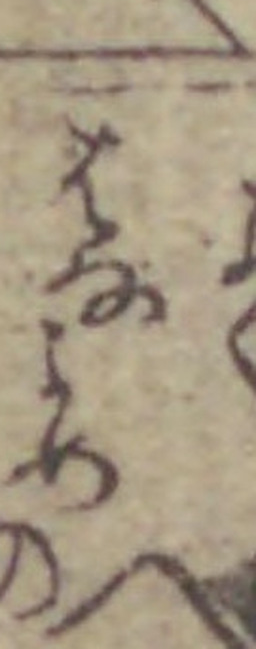はなよめの
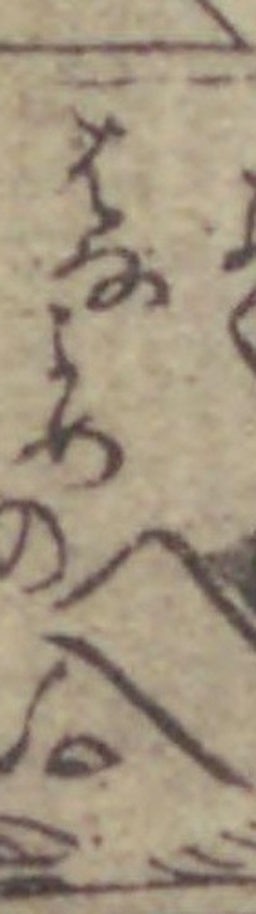はなよめの
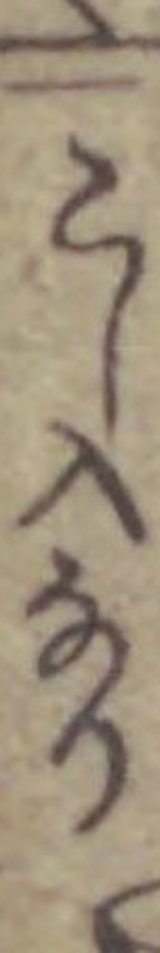こし入なり
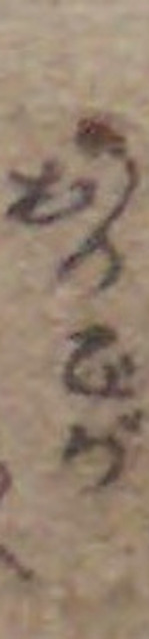おかごが
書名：狆の嫁入 2巻
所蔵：国立国会図書館 National Diet Library, JAPAN
